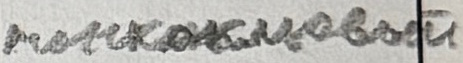тонкоклювый
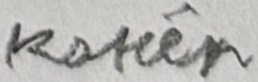конёк
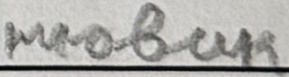тювик
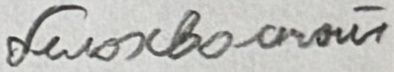белохвостый
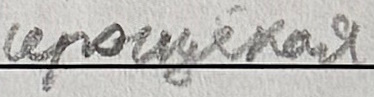серощёкая
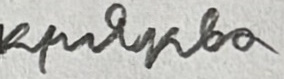кряква
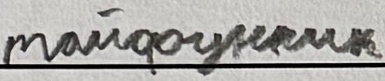тайфунник
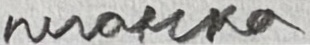пеганка
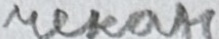чекан
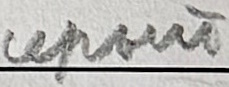серый
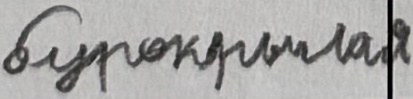бурокрылая
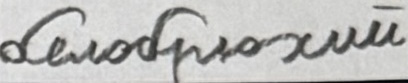белобрюхий
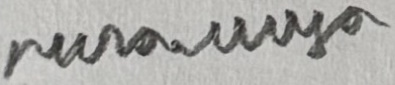пигалица
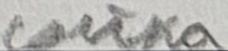сойка
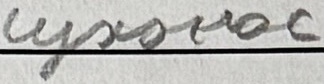сухонос
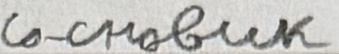сосновик
